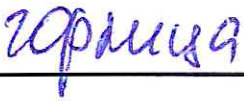горлица
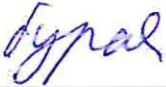бурая
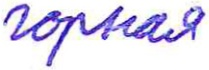горная
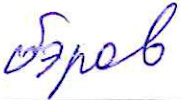бэров
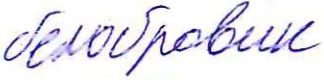белобровик
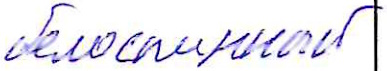белоспинный
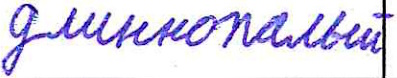длиннопалый
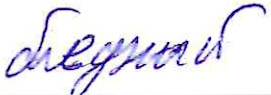бледный
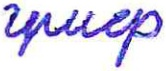гриф
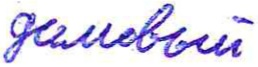димовый
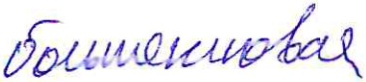большеклювая
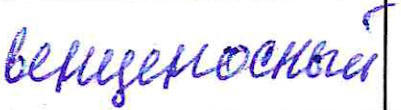венценосный
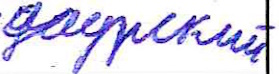даурский
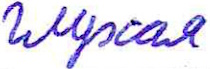глухая
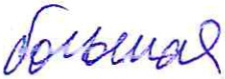большая
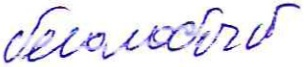белолобый
